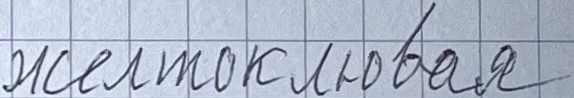желтоклювая
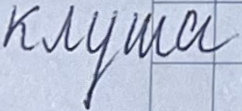клуша
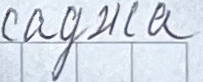саджа
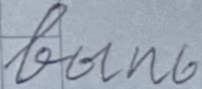выпь
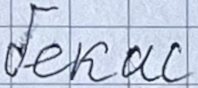бекас
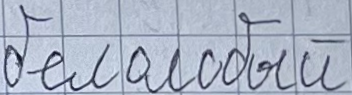белолобый
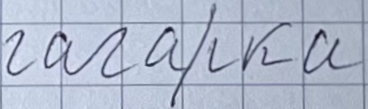гагарка
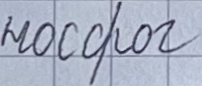носорог
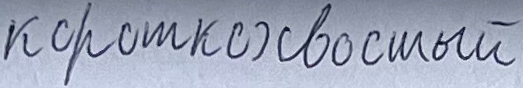короткохвостый
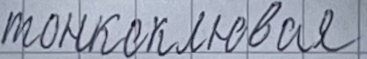тонкоклювая
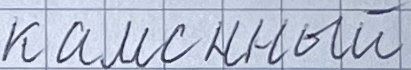каменный
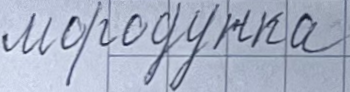мородунка
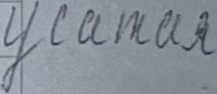усатая
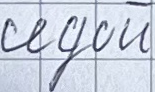седой
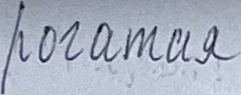рогатая
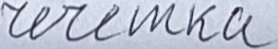чечетка
